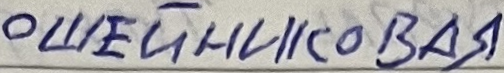ошейниковая
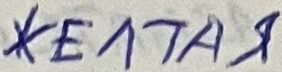желтая
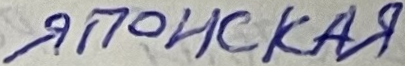японская
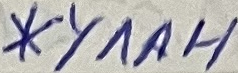жулан
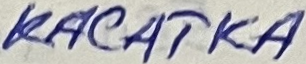касатка
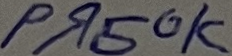рябок
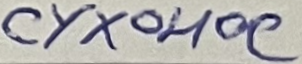сухонос
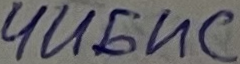чибис
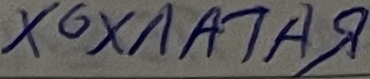хохлатая
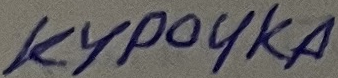курочка
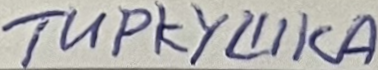тиркушка
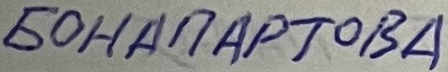бонапартова
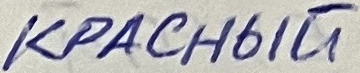красный
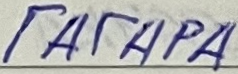гагара
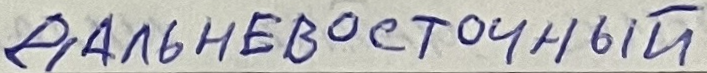дальневосточный
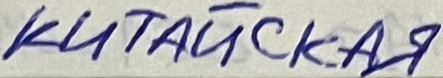китайская
